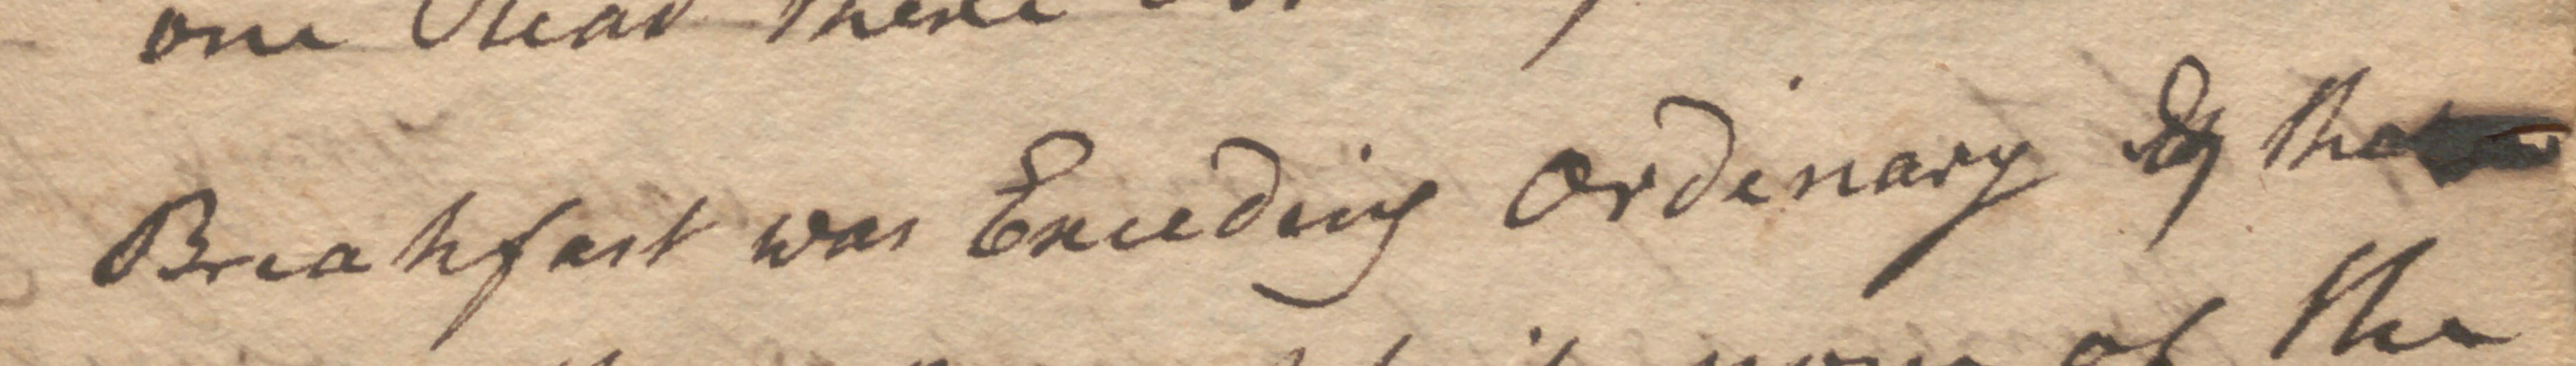Breakfast was Exceding ordinary & tha
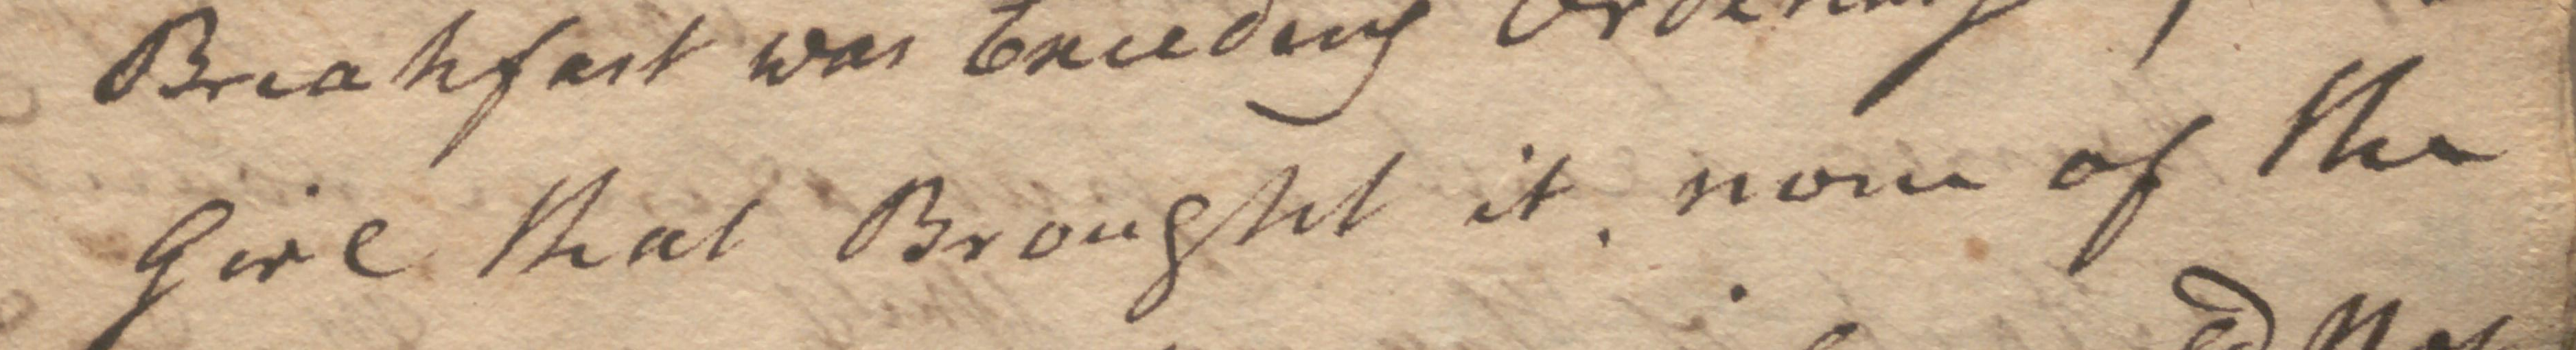Girl that Brought it, none of the
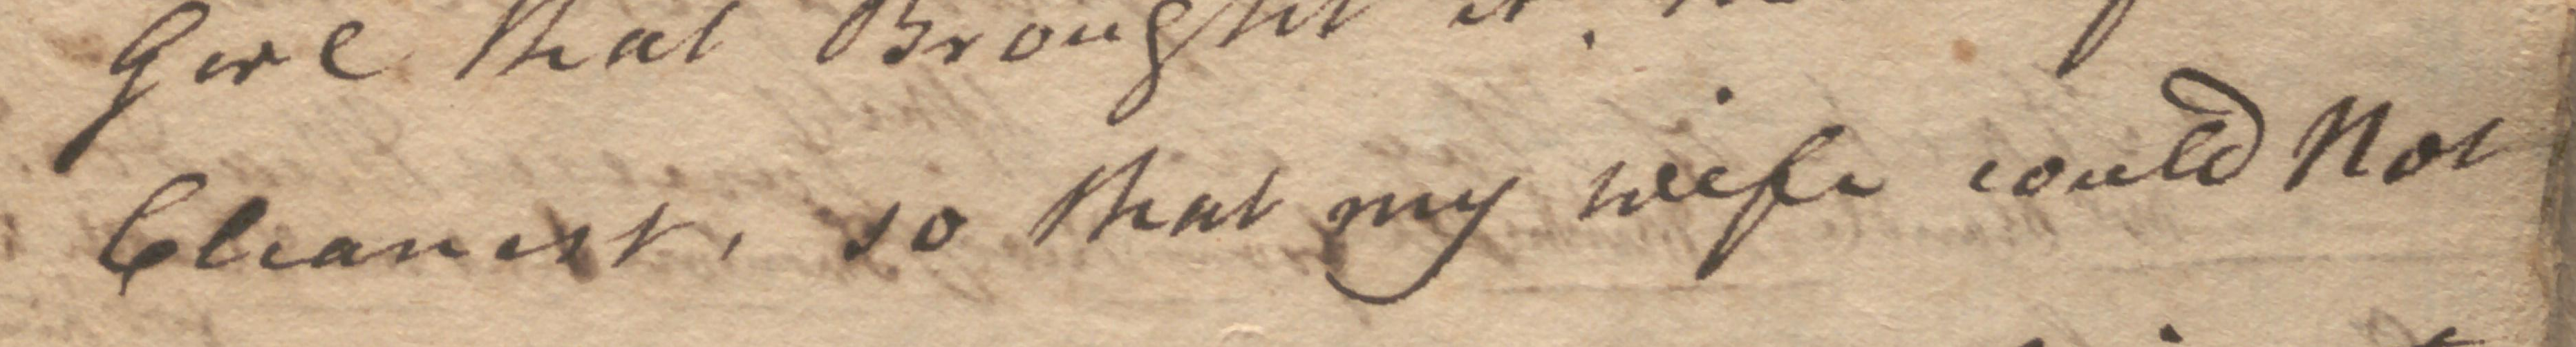Cleanest, so that my wife could Not
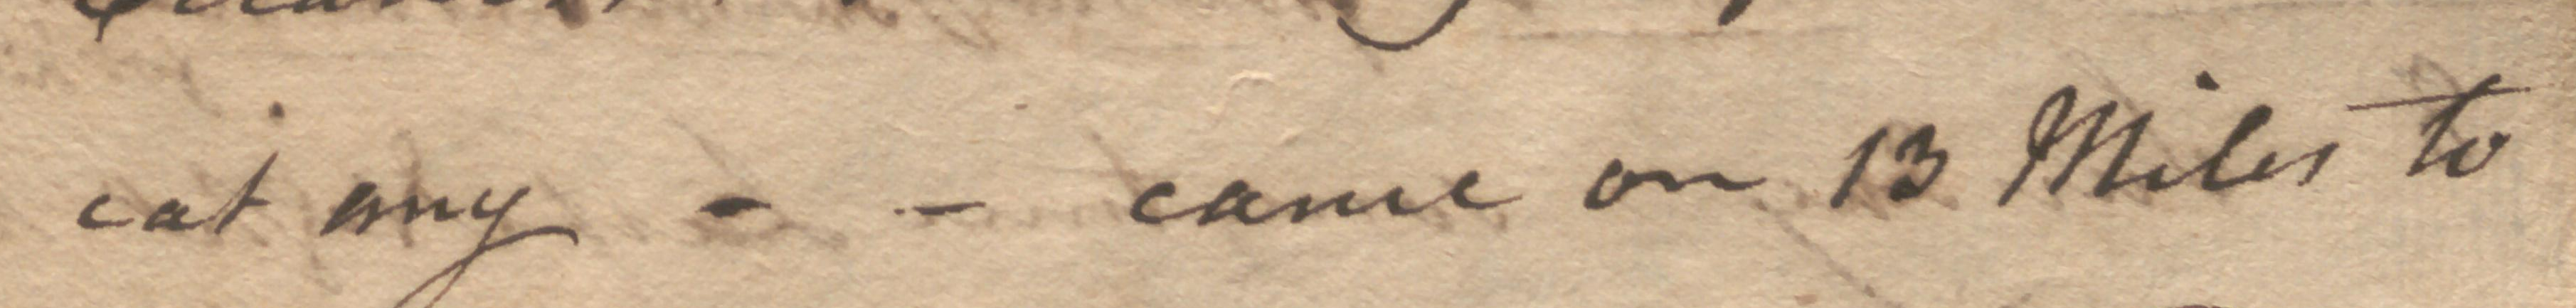eat my-- came on 13 Miles to
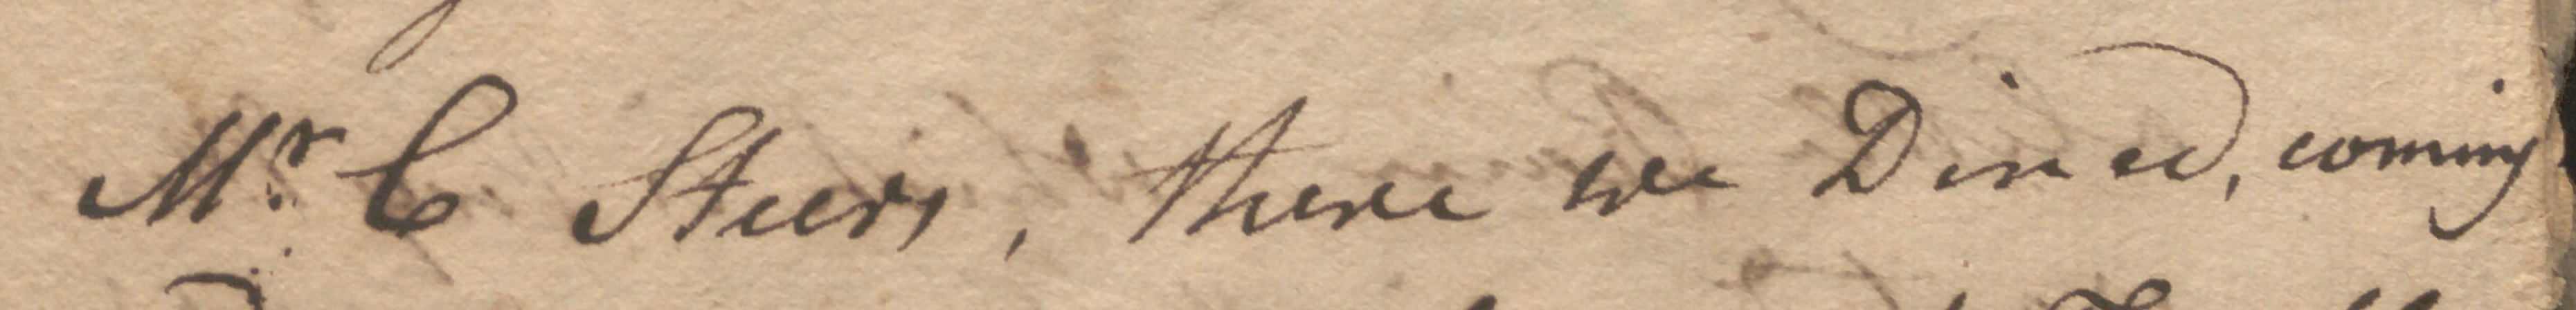M^r. C. Steers, there we Dined, coming
